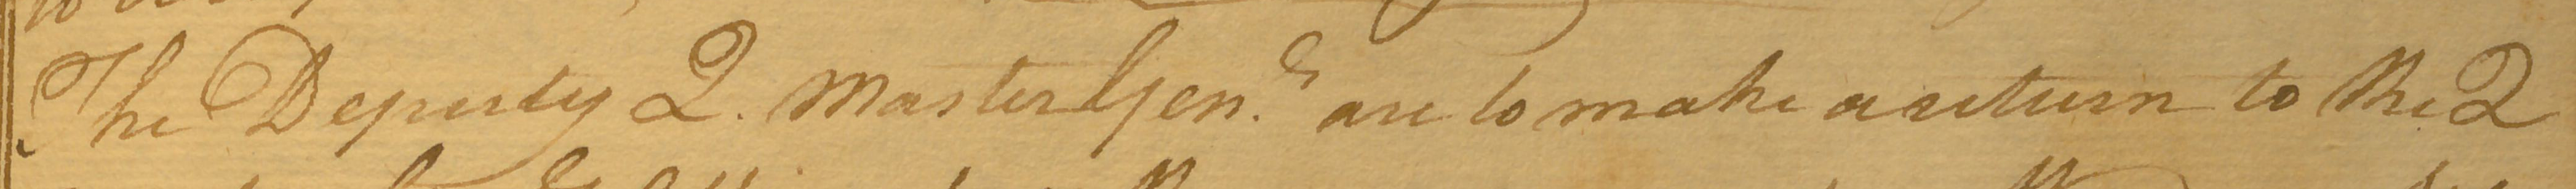The Deputy Q. Master Gen^ls. are to make a return to the Q
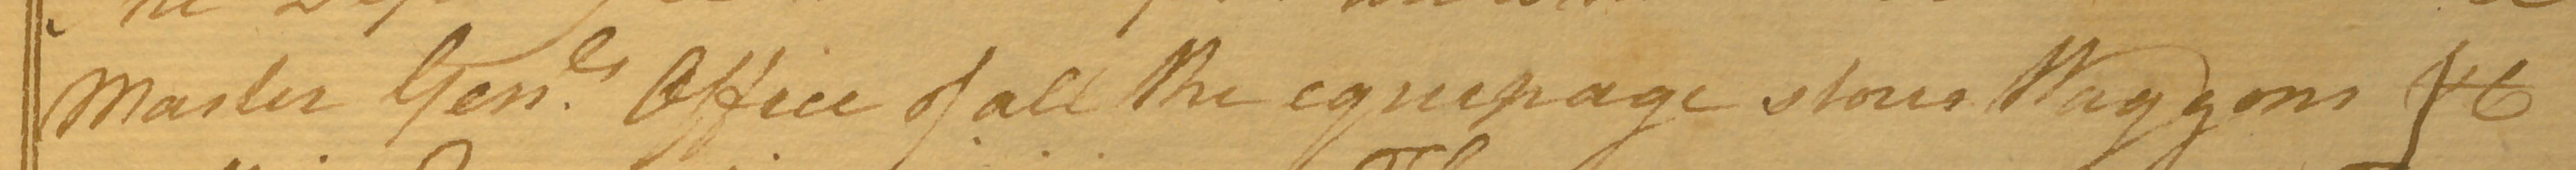master Gen^ls. Office of all the equipage stores Waggons &c
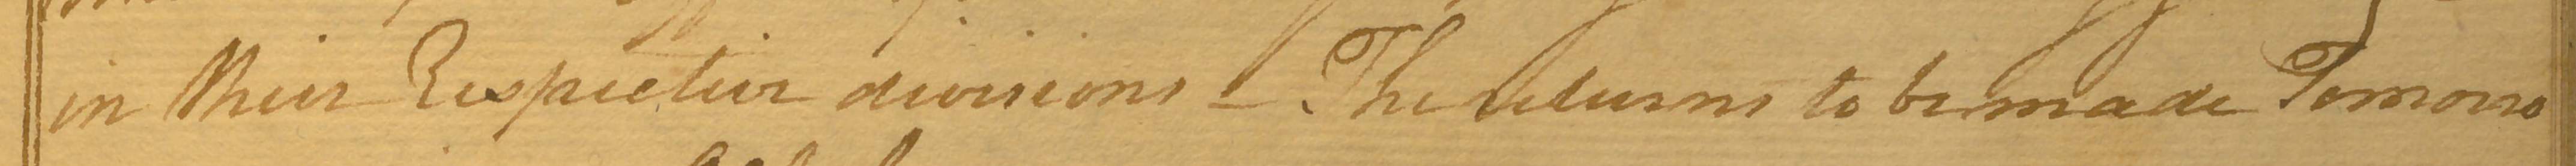in their respective divisions-. The returns to be made Tomorro
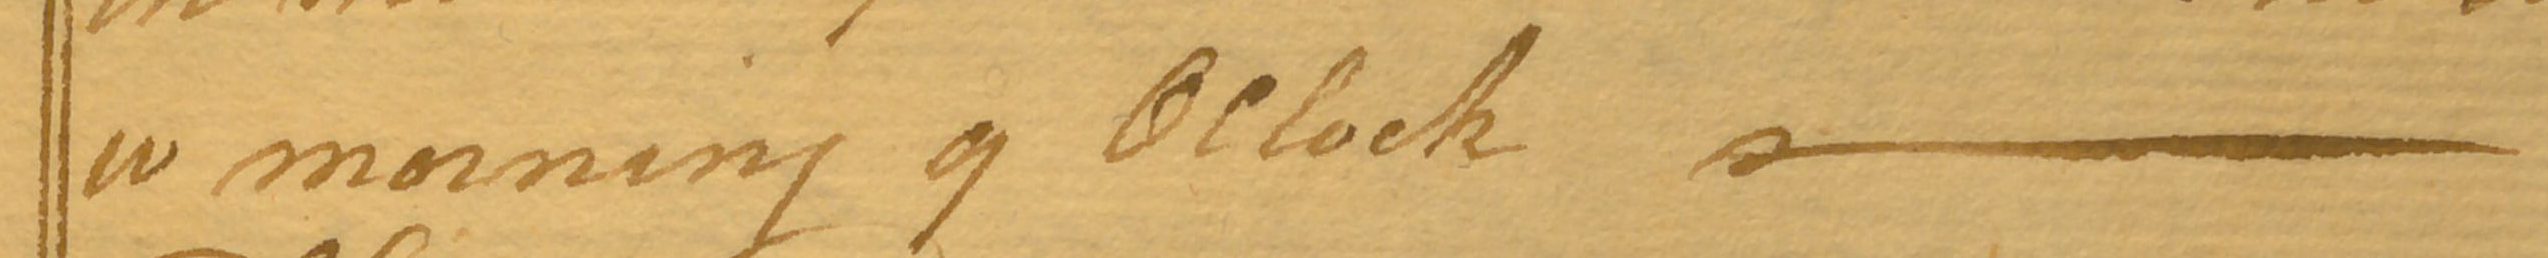w morning 9 OClock-
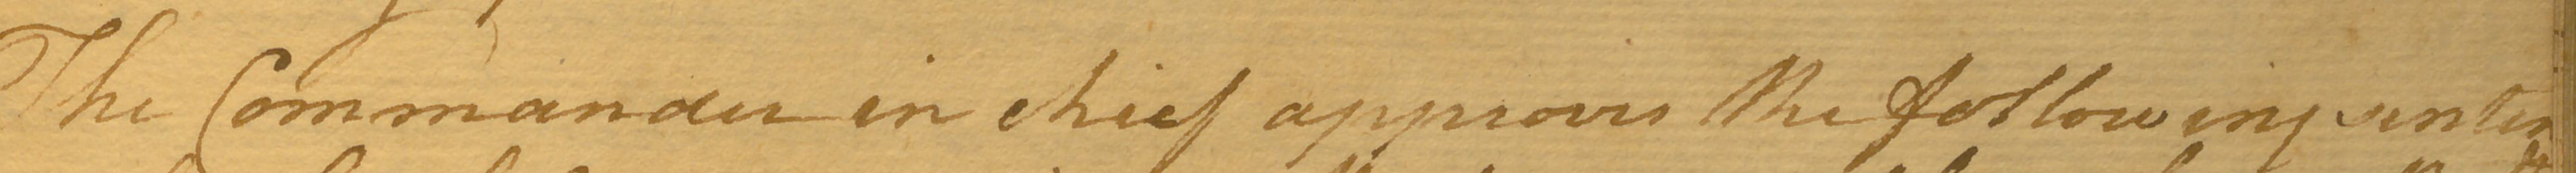The Commander in chief approves the following senten
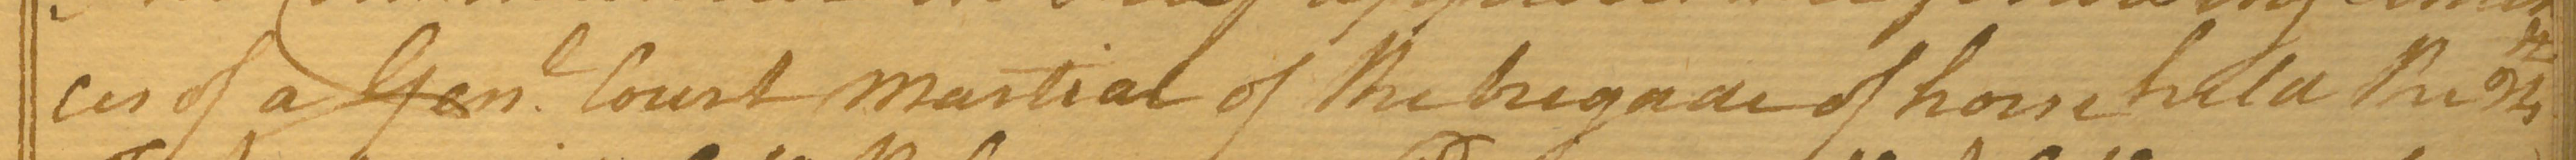ces of a Gen^L. Court martial of the brigade of horse held the 24^th
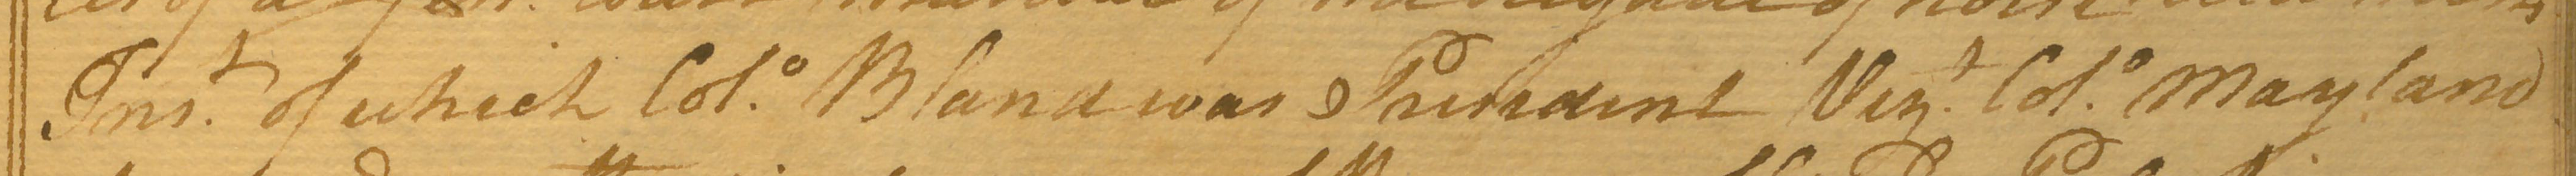Ins^t. of which Col^o. Bland was President Viz^t. Col^o. Maryland
